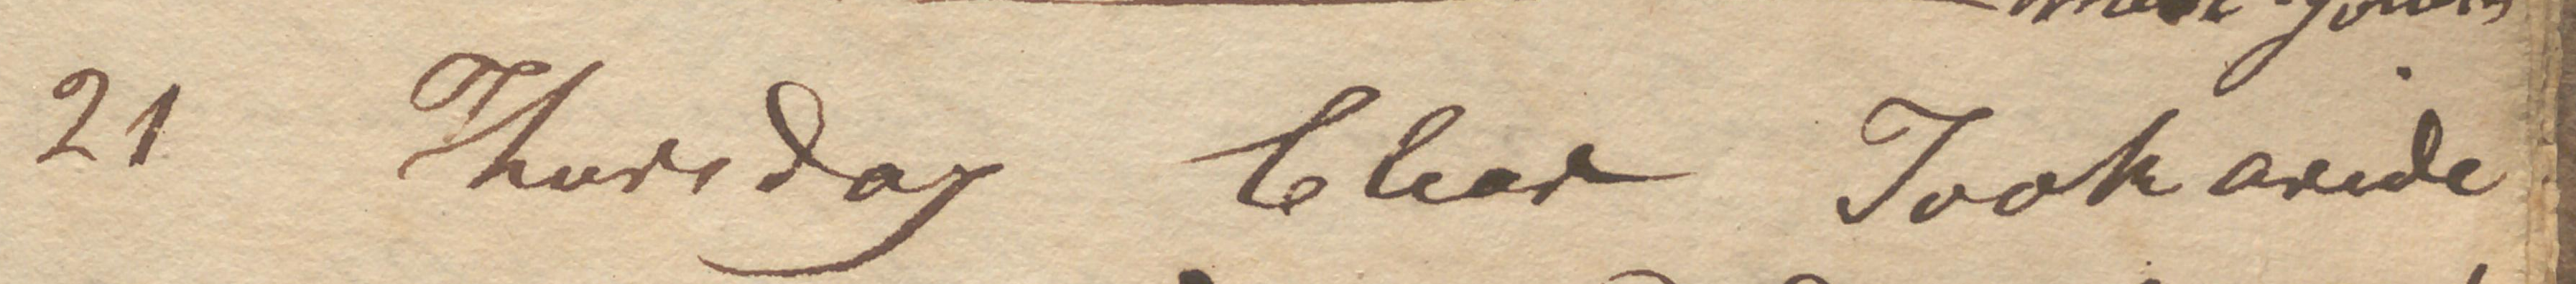21 Thursday Clear Took a ride
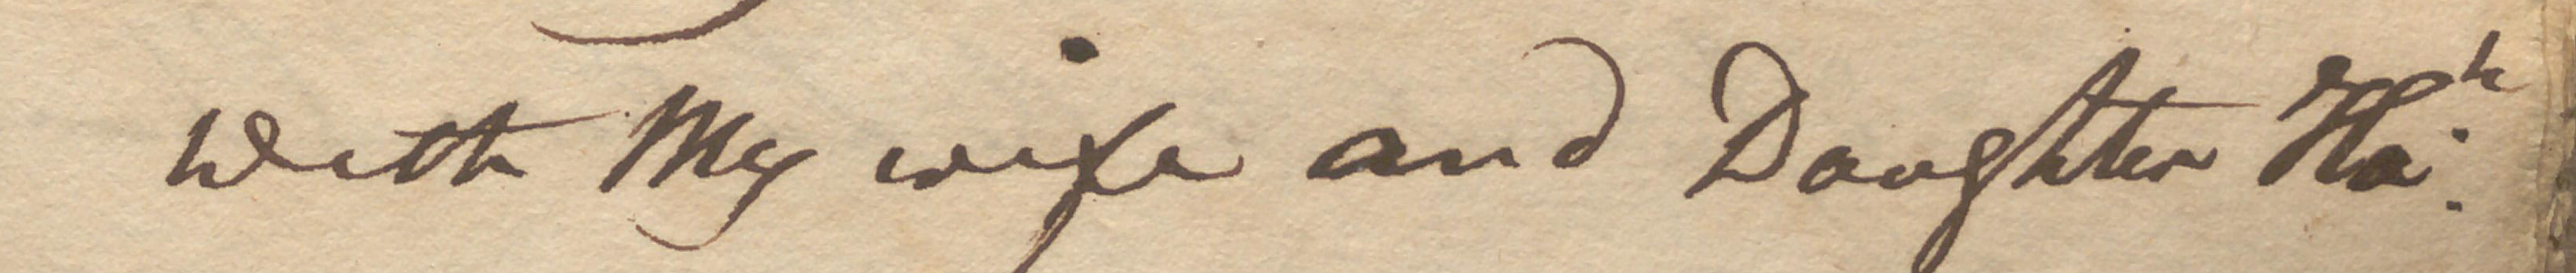with My wife and Daughter Ha^h:
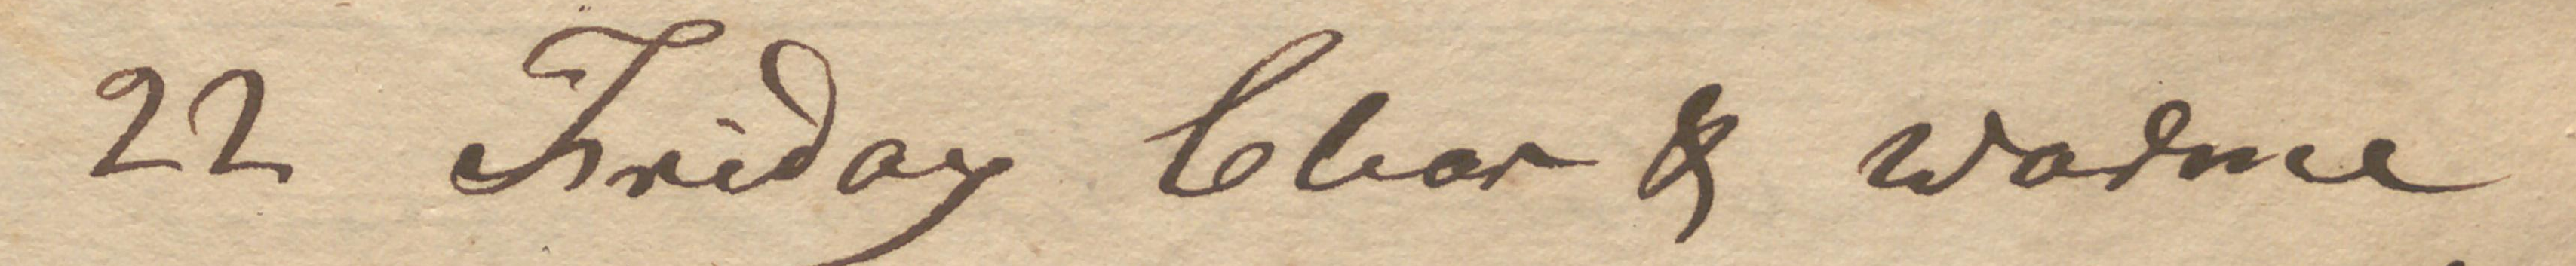22 Friday Clear & warme
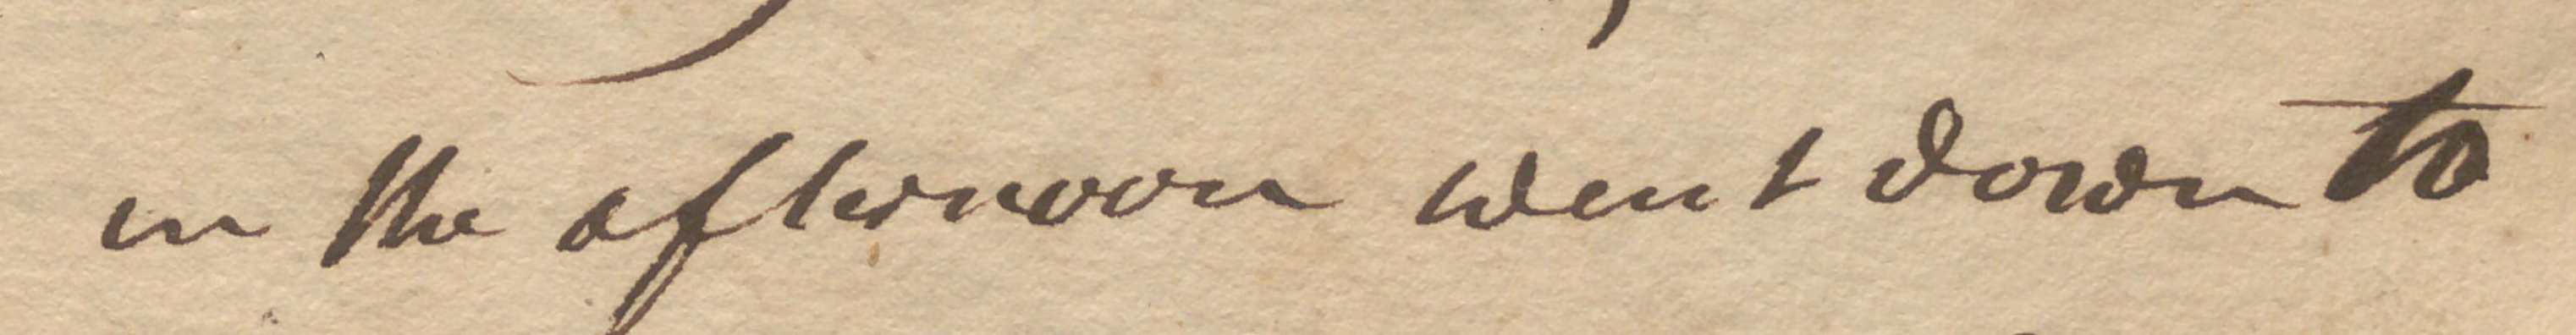in the afternoon went down to
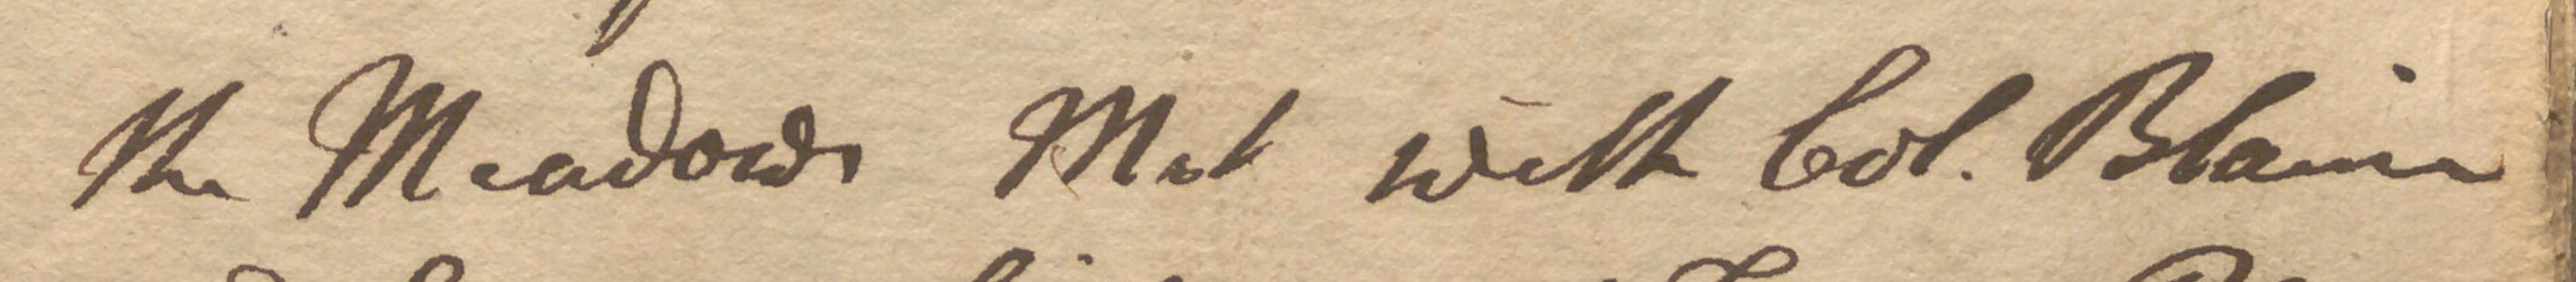the Meadows Met with Col. Blaine
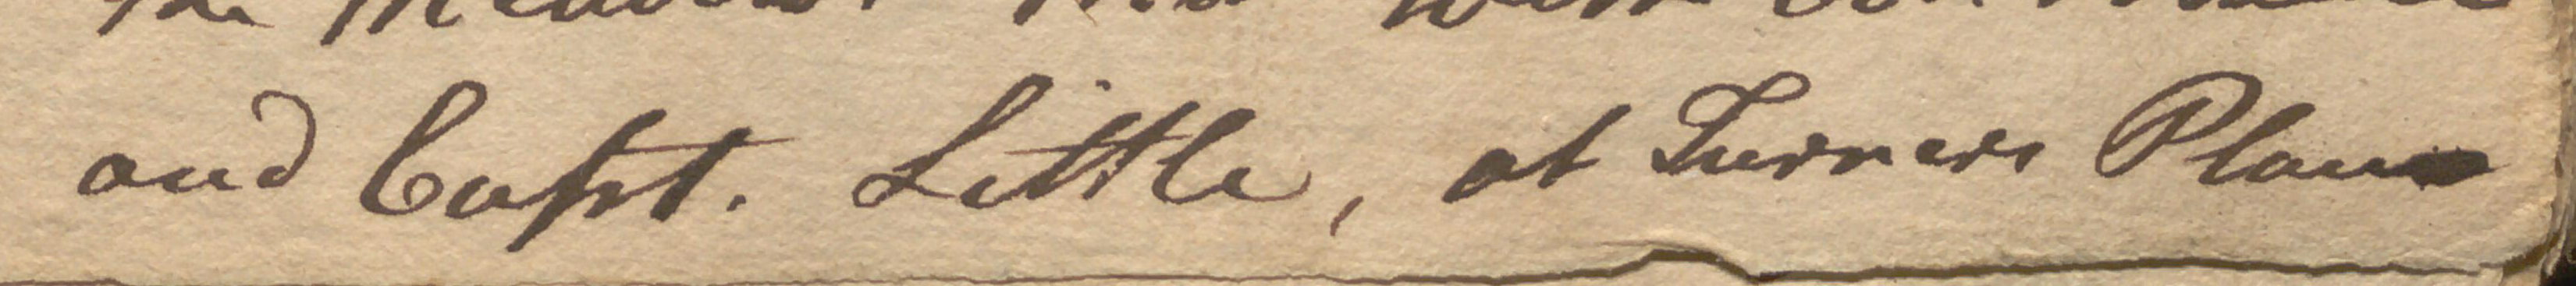and Capt. Little, at Turners Plan
